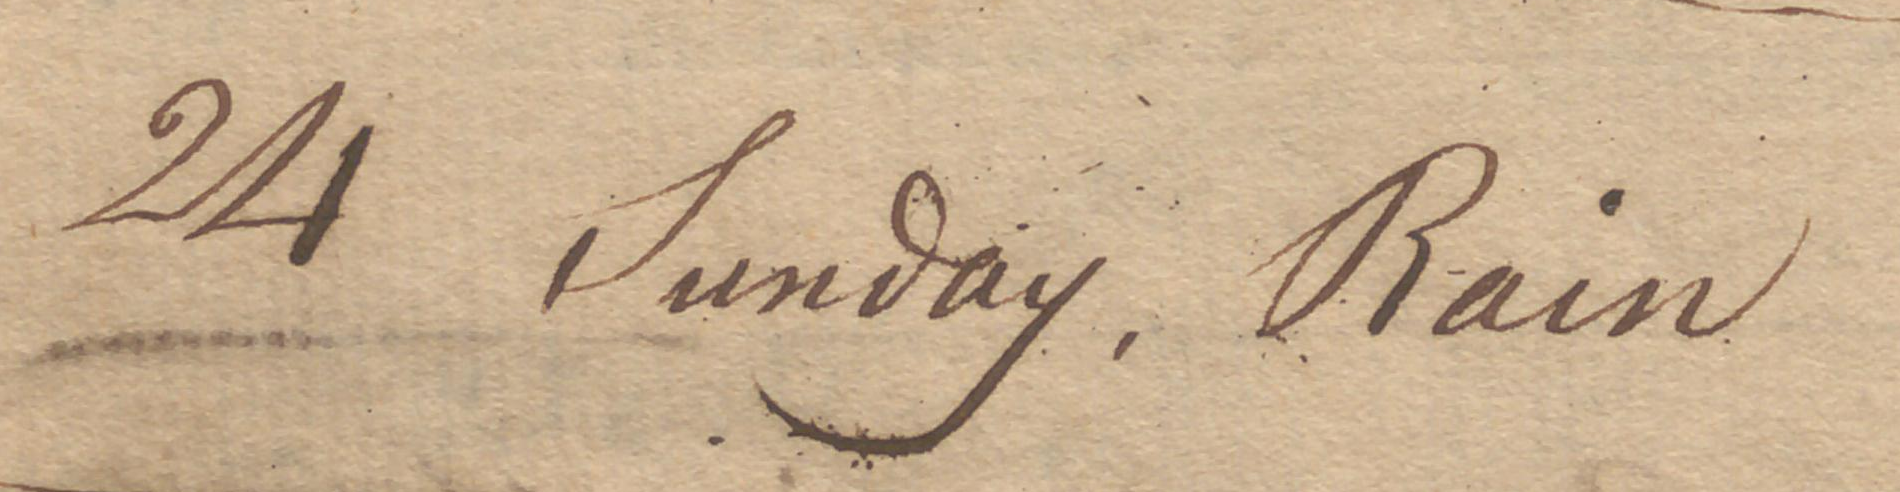24 Sunday. Rain
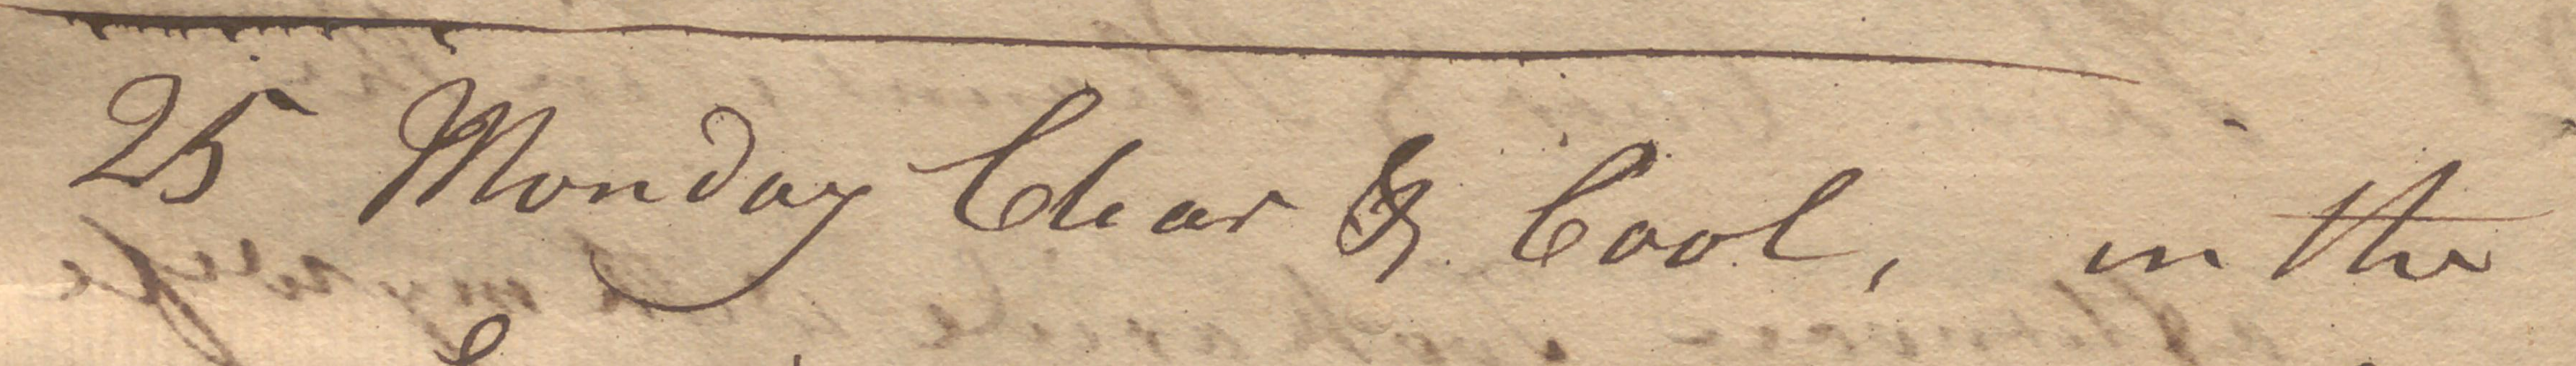25 Monday Clear & Cool, in the
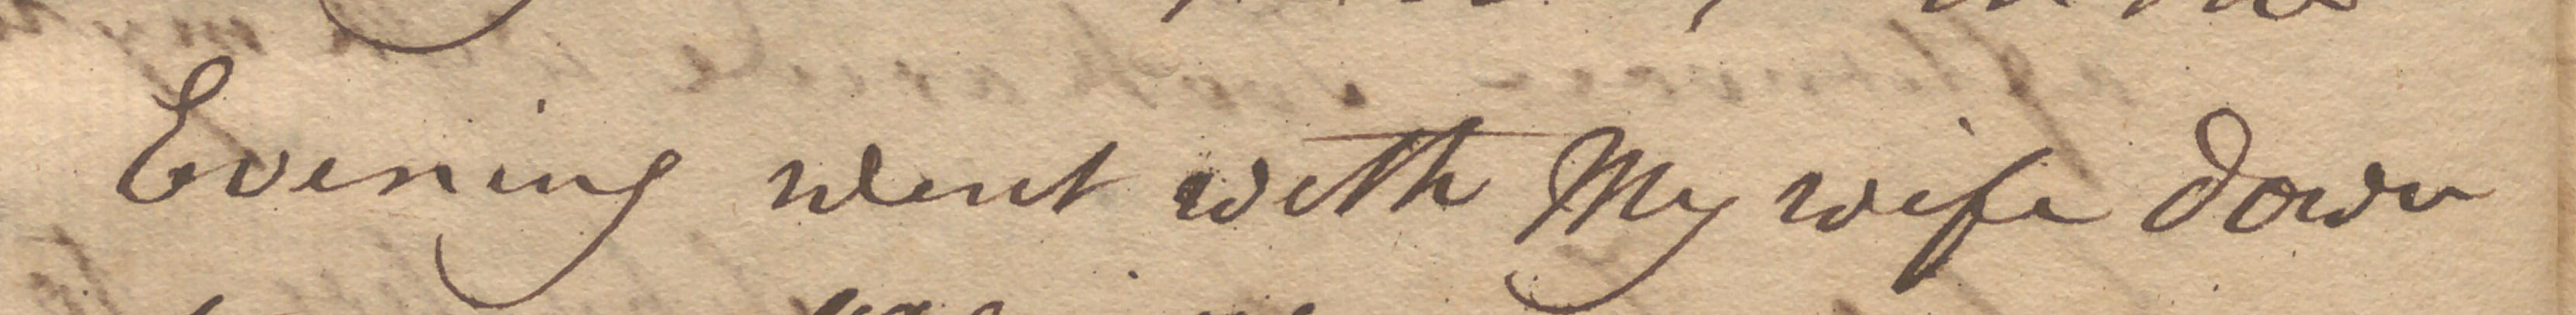Evening went with My wife down
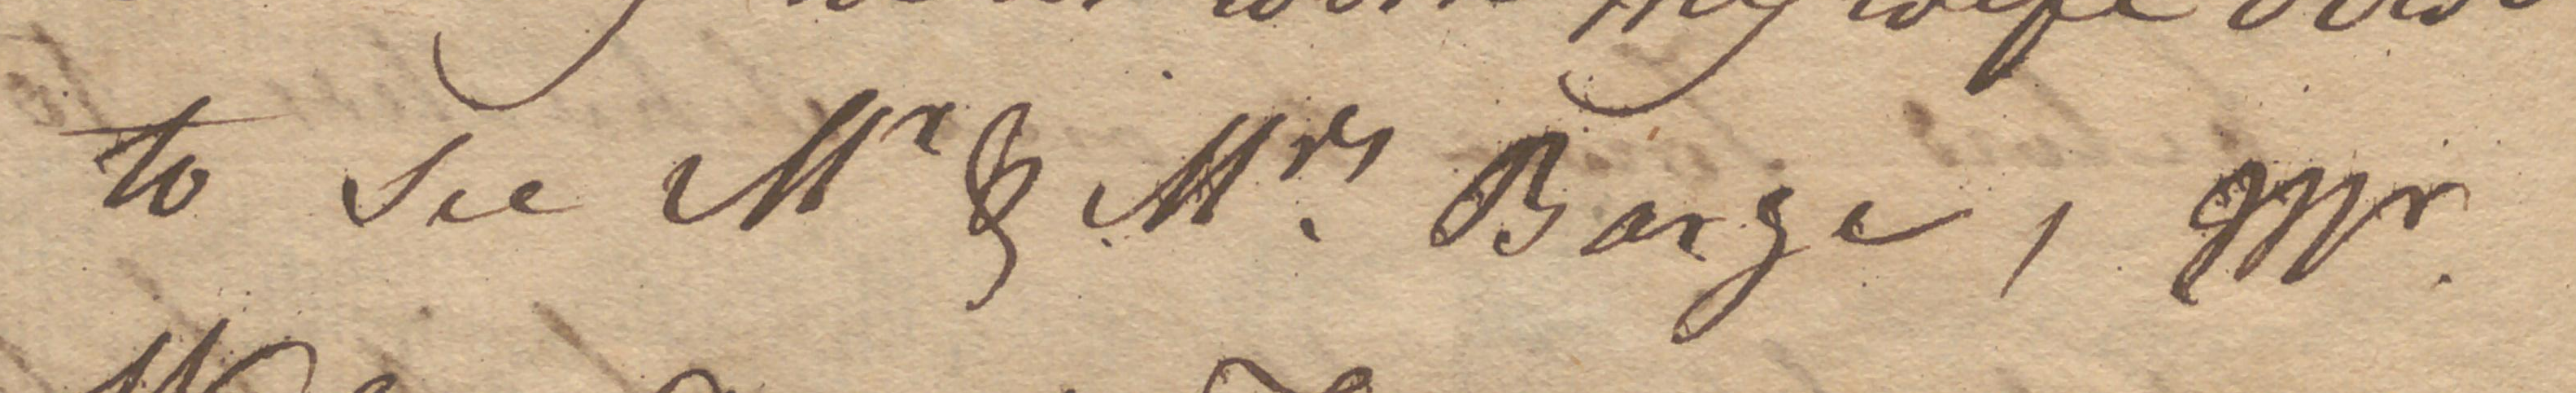to see M^r & M^rs. Barge, M^r.
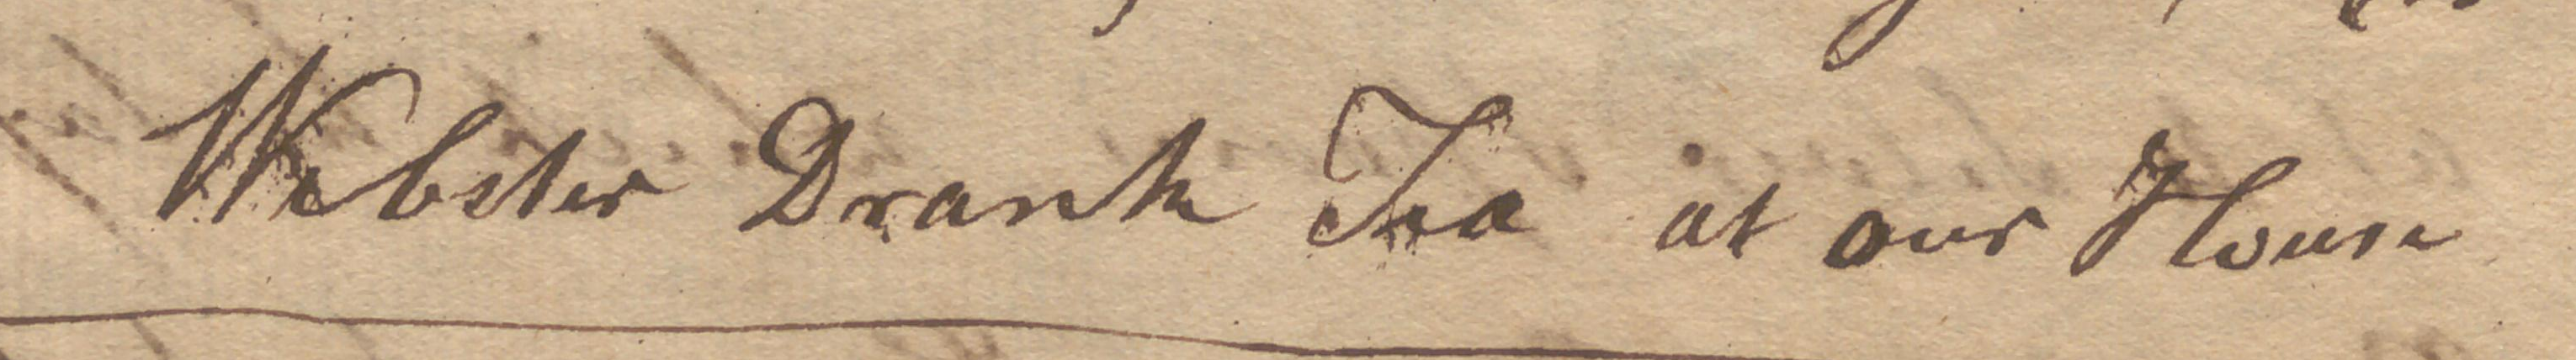Webster Drank Tea at our & House
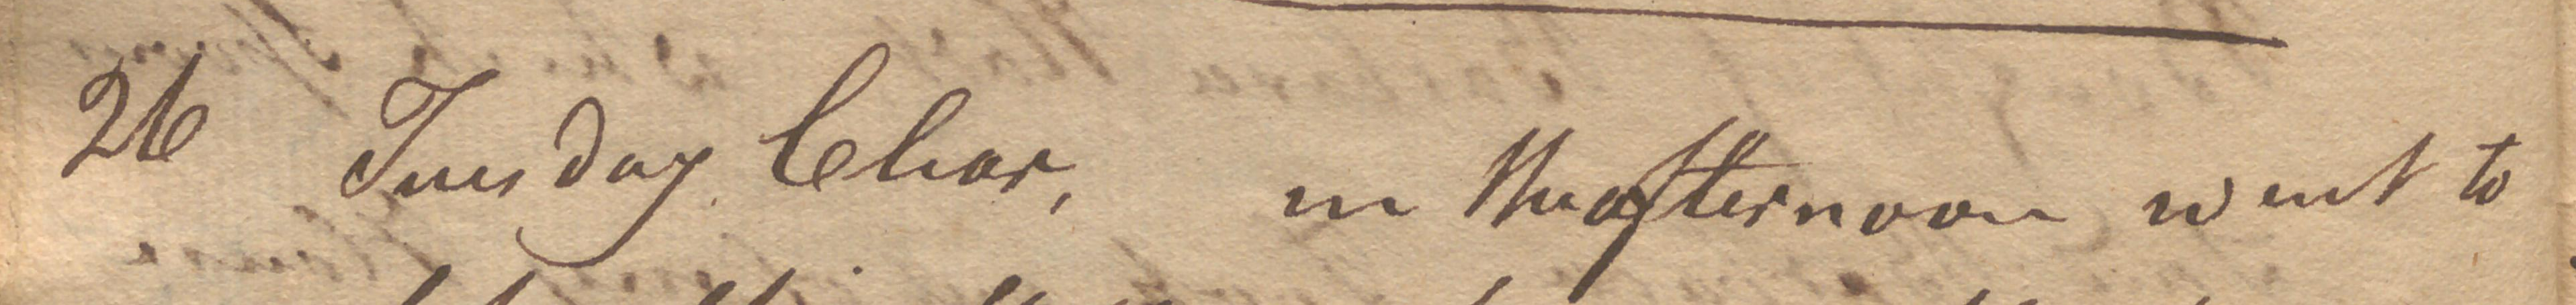26 Tuesday Clear in the afternoon went to
